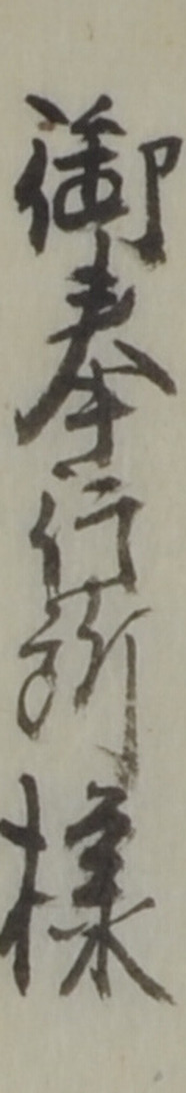御奉行所様
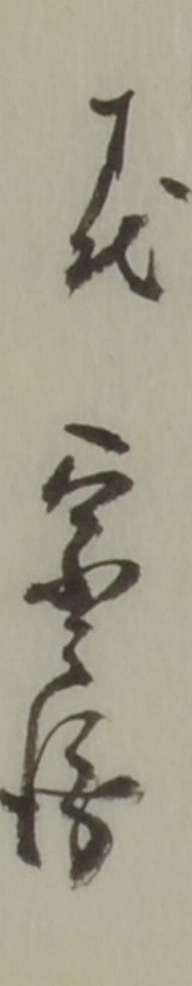丁代宗兵衛
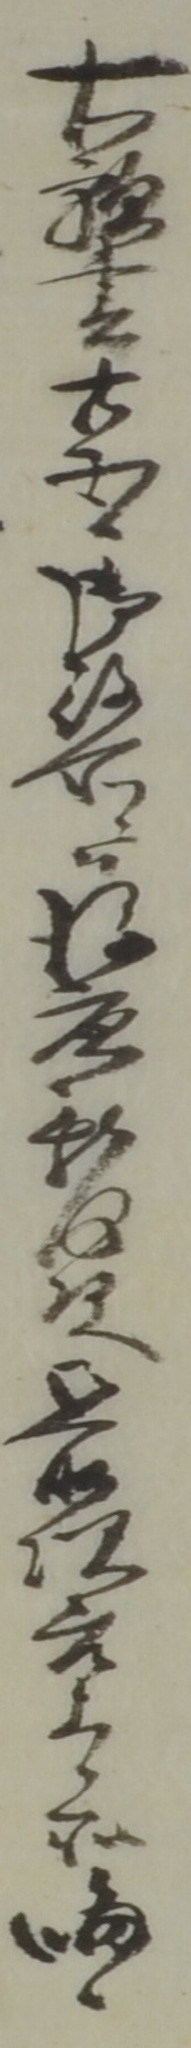右願書廿五日御役所ニ而後藤新介殿御取次差上候所晦日
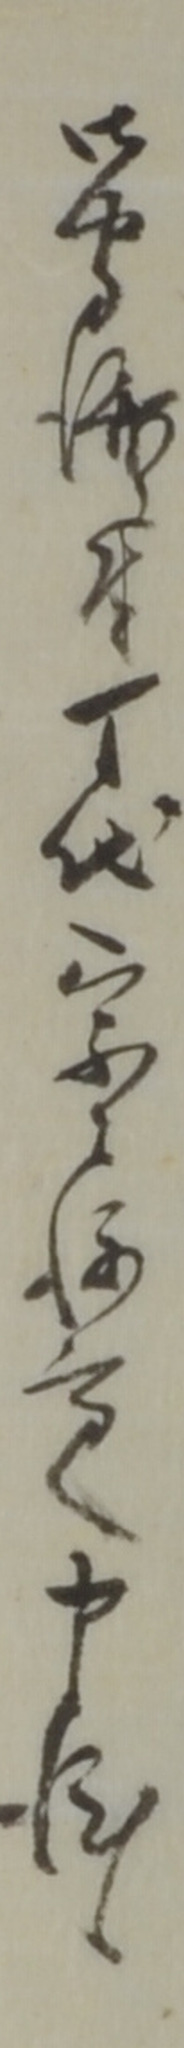御聞済二付丁代宗兵衛方へ申渡候

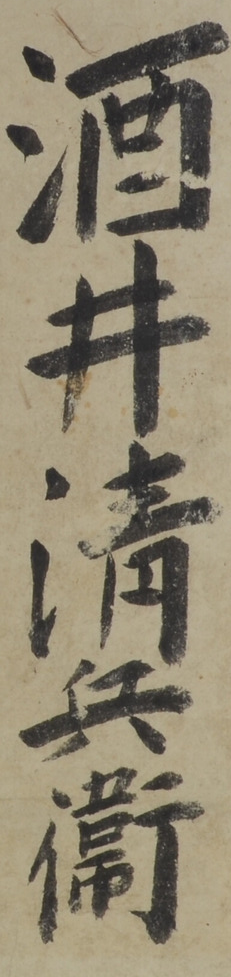酒井清兵衛
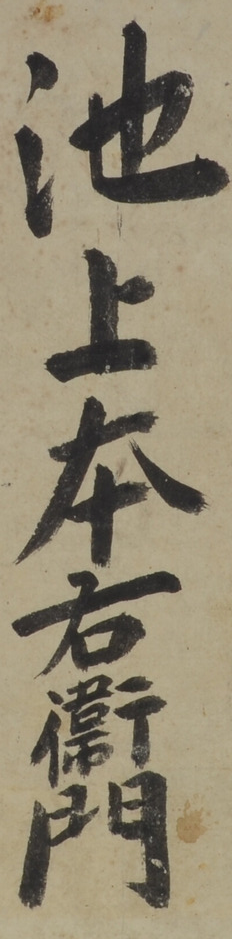池上本右衛門
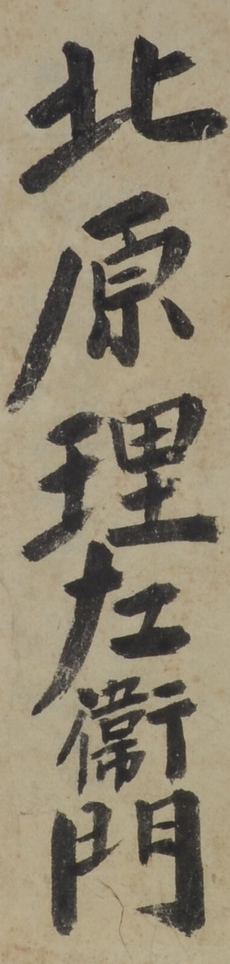北原理左衛門
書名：諸願書控簿
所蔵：伊那市立高遠町図書館・合同会社AMANE
